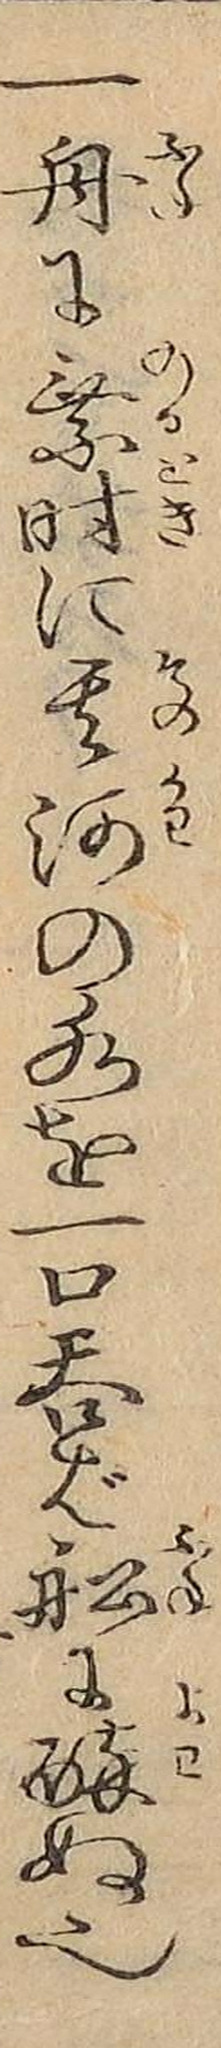一舟に乗時に其河の水を一口呑ば船に酔ぬ也
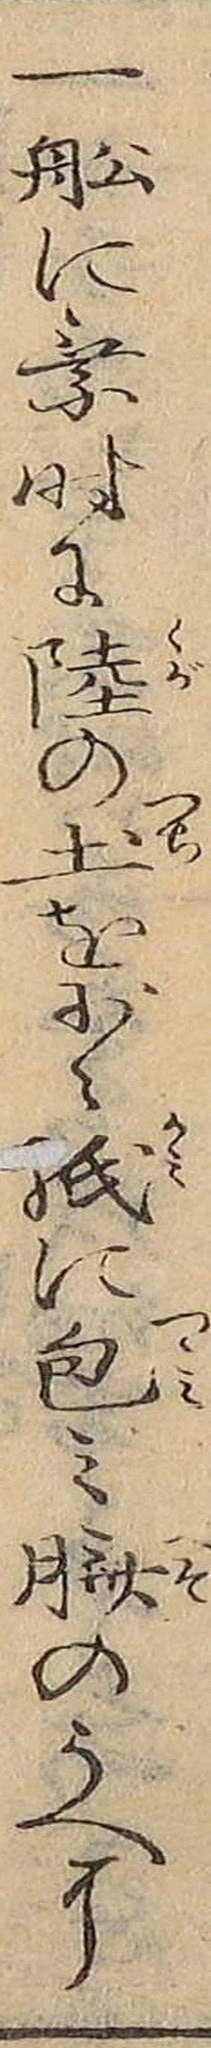一船に乗時に陸の土を少々紙に包み臍のうへに
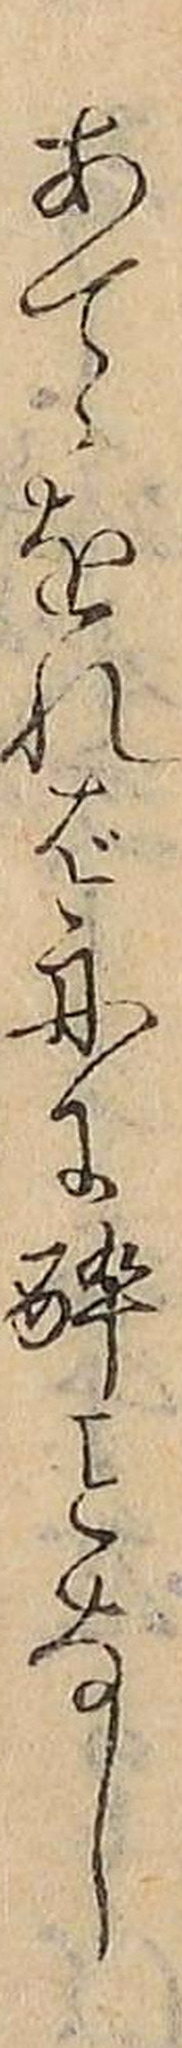あてゝをれば舟に酔ことなし
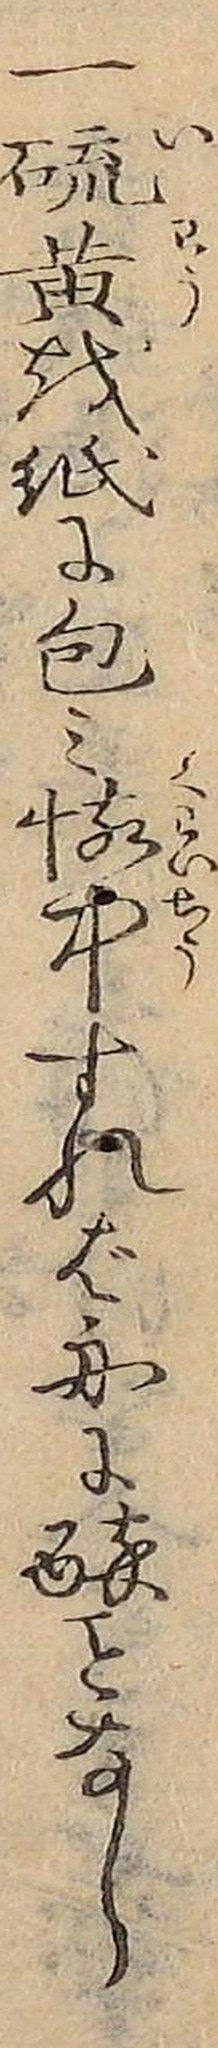一硫黄を紙に包み懐中すれば舟に酔ことなし
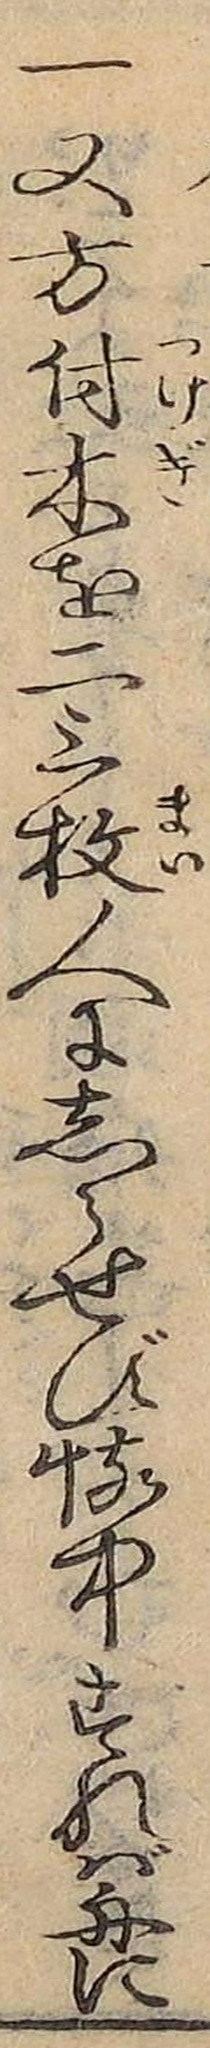一又方付木を二三枚人にしらせず懐中すれば舟に
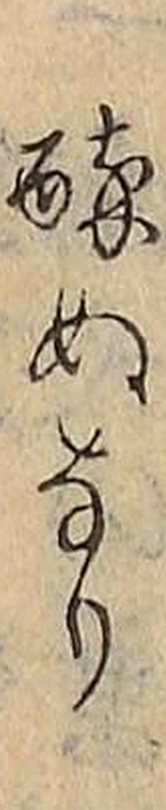酔ぬなり
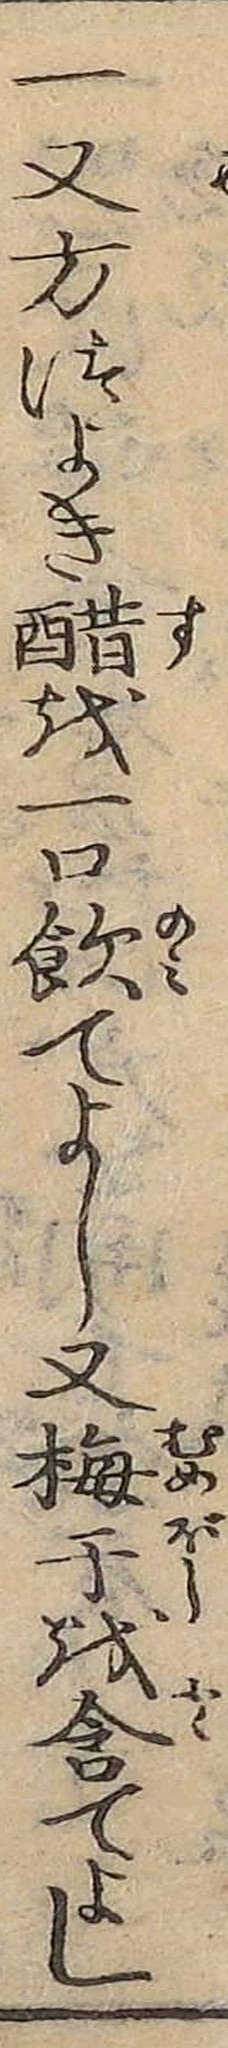一又方つよき醋を一口飲てよし又梅干を含てよし
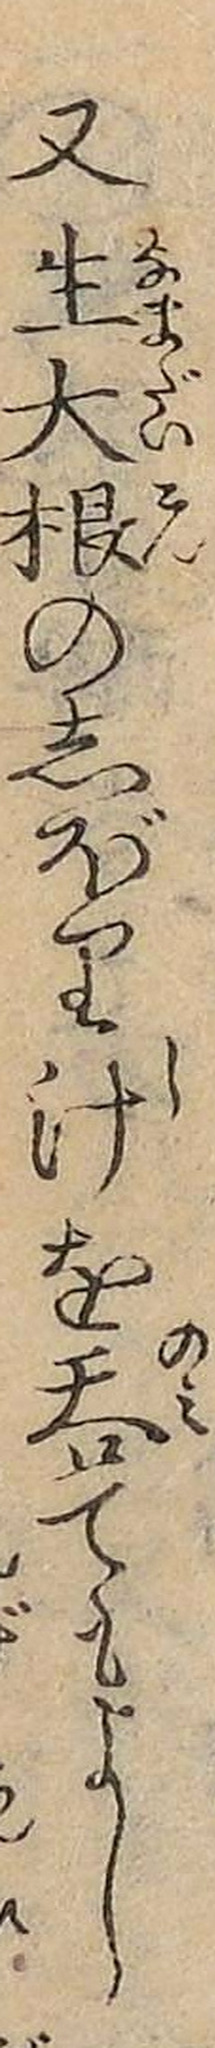又生大根のしぼり汁を呑てもよし
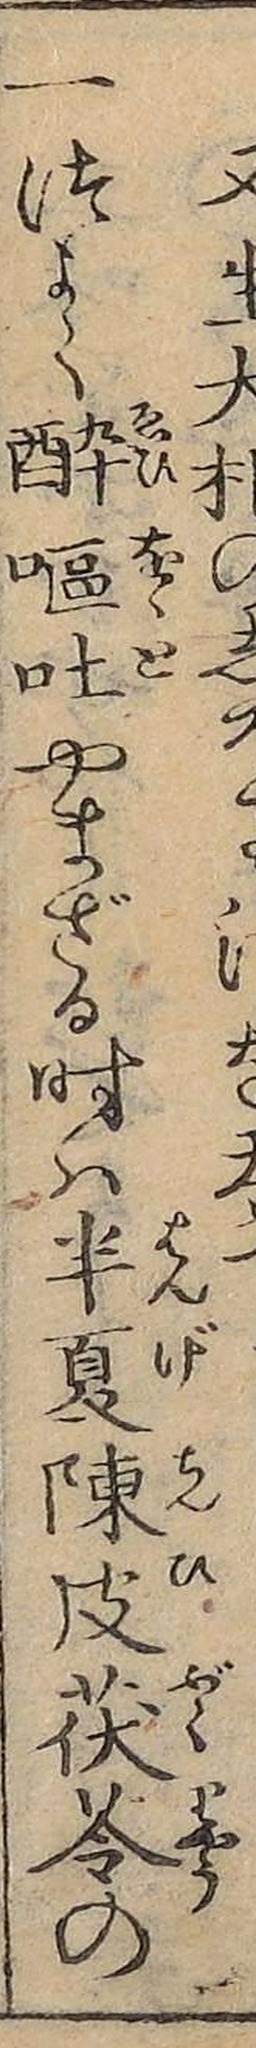一つよく酔嘔吐やまざる時は半夏陳皮茯苓の

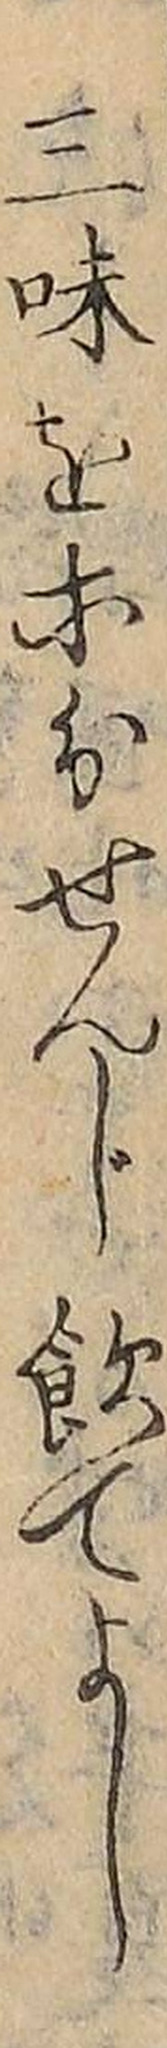三味を等分せんじ飲てよし
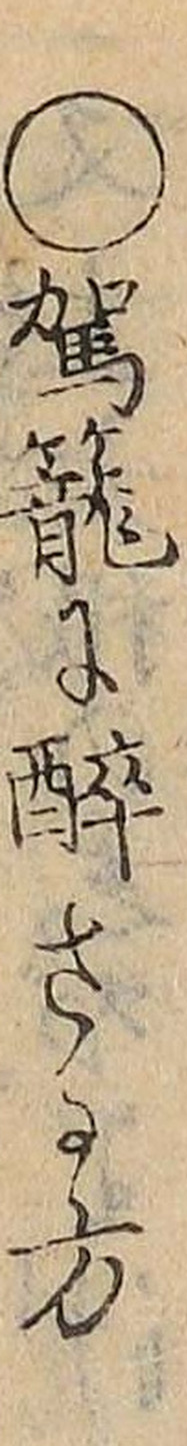○駕籠に酔さる方
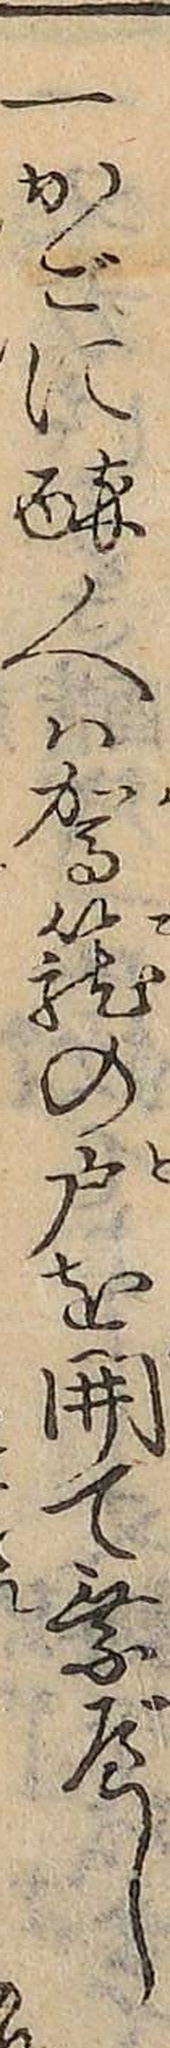一かごに酔人は駕籠の戸を開て乗べし
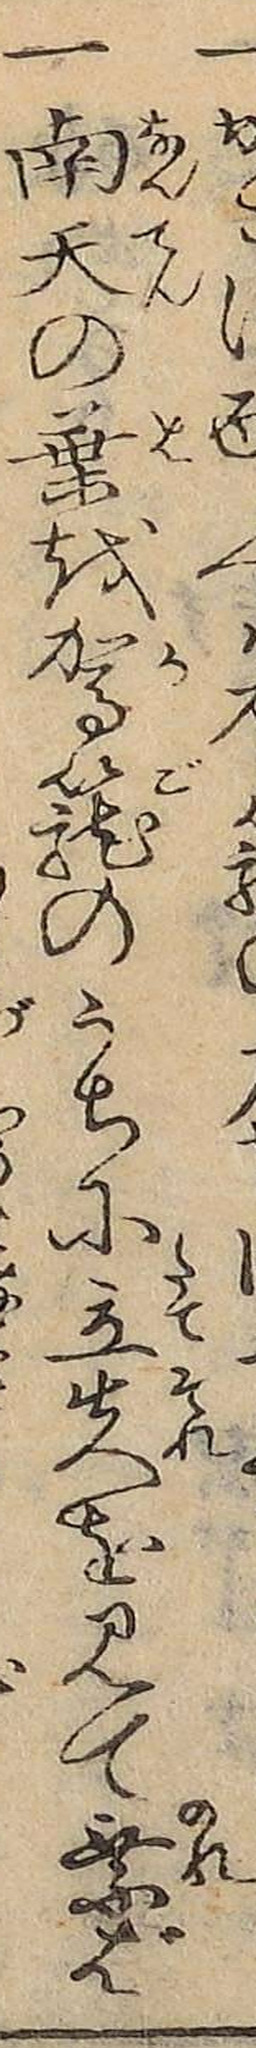一南天の葉を駕籠のうちに立先を見て乗ば
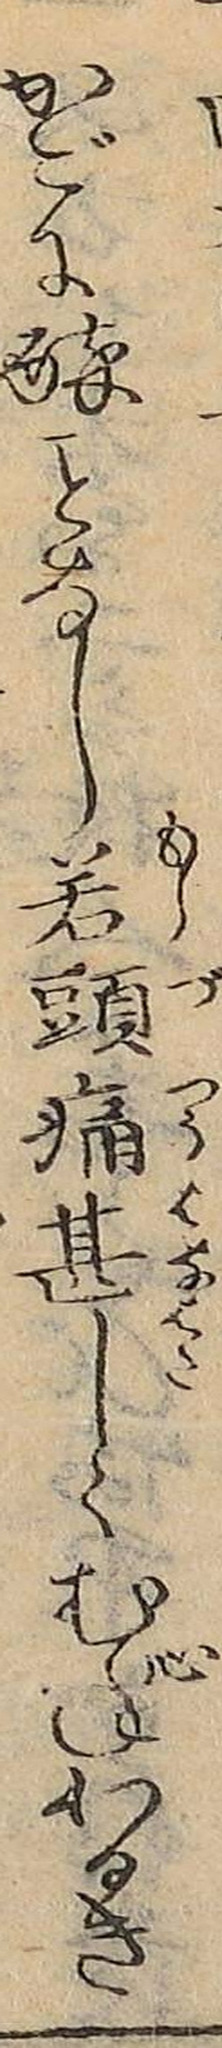かごに酔ことなし若頭痛甚しくむねわるき
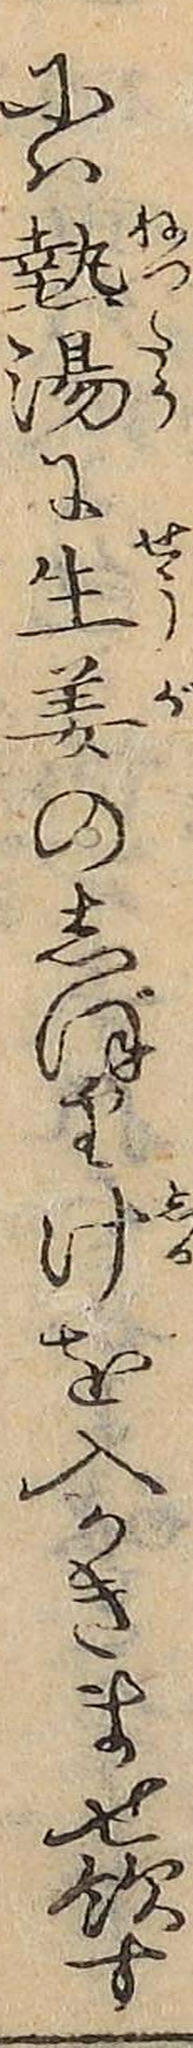には熱湯に生姜のしぼり汁を入かきませ飲す
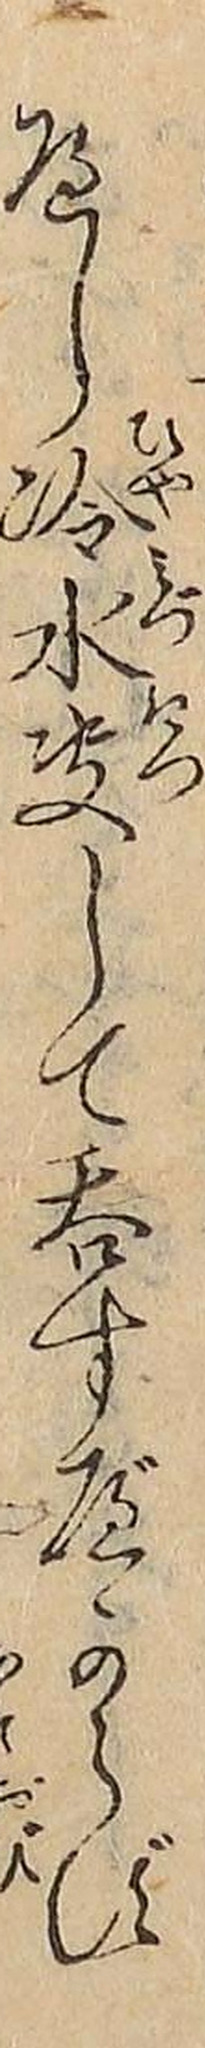へし冷水決して呑すべからず
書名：旅行用心集
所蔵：神戸大学附属図書館 国文学研究資料館
